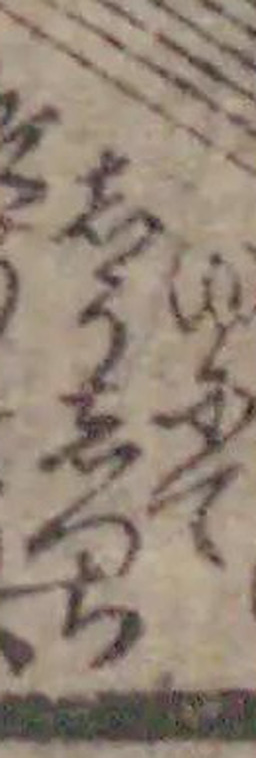しうしつち
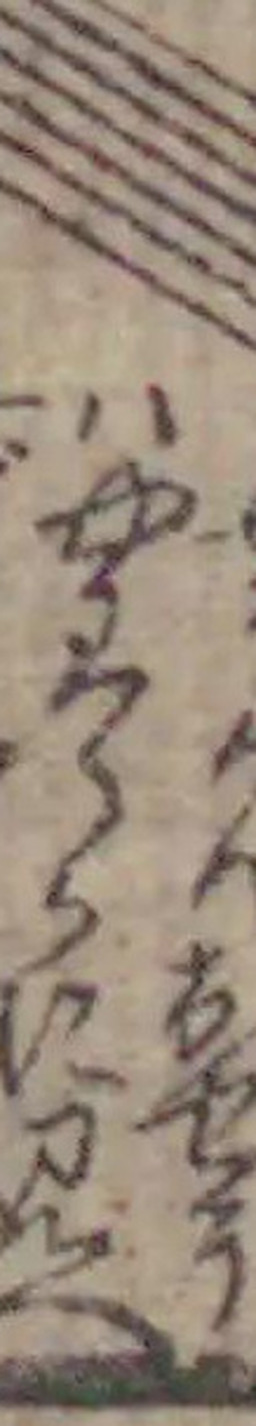はやわらかに見へ
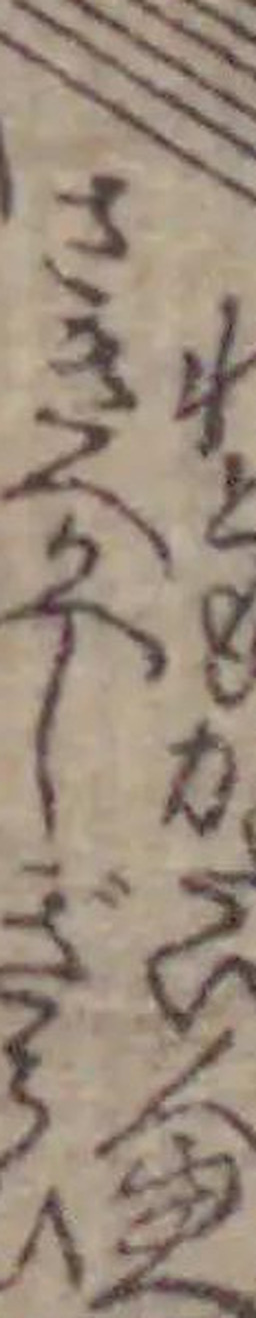さきへかへしぎうひ
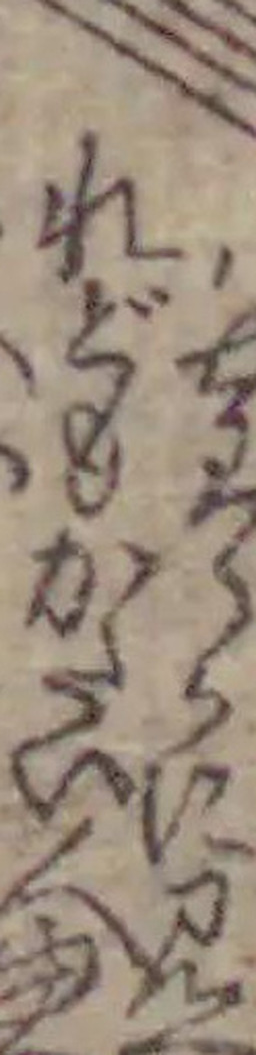れどもかたい人ゆへ
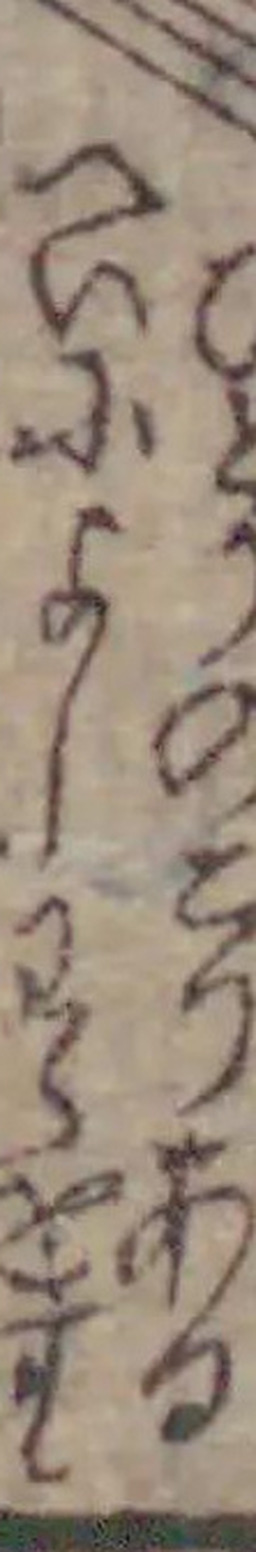へいによしわらをすゝ
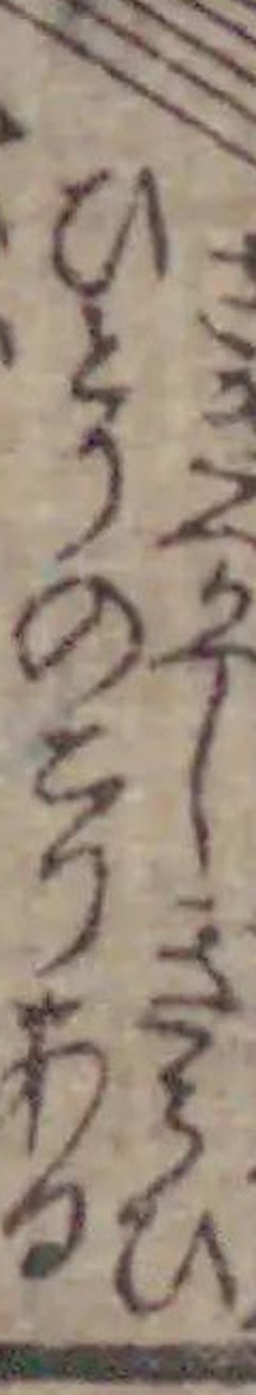ひとりのこりある
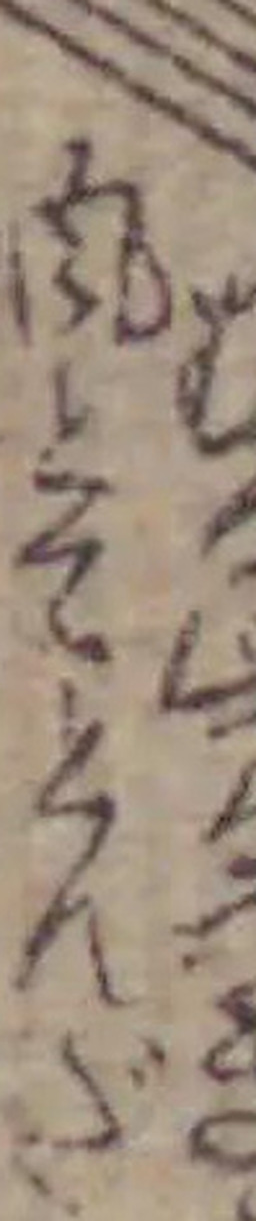風とてとんだ
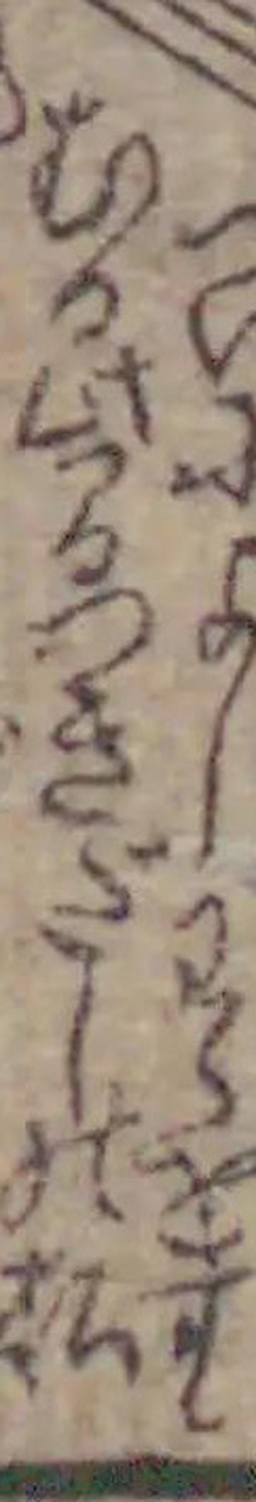むる此間つきだしの松
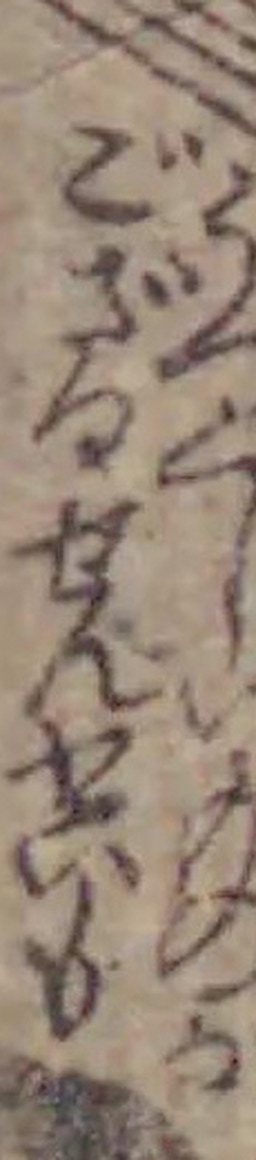ござるせんせいも
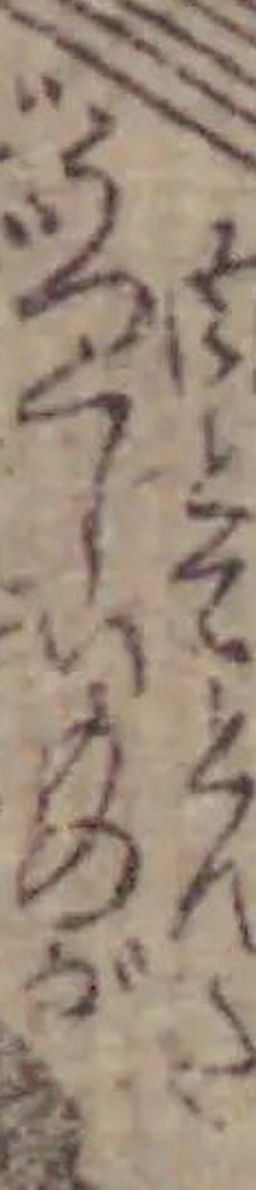うつくしいものが
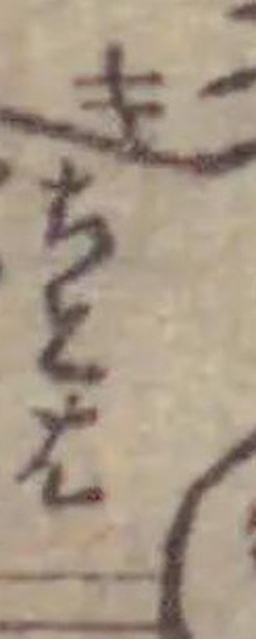ちとは
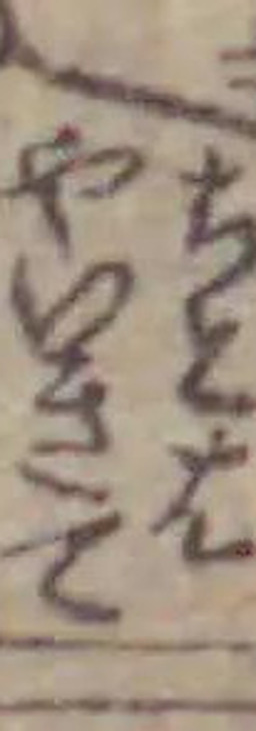やいきて
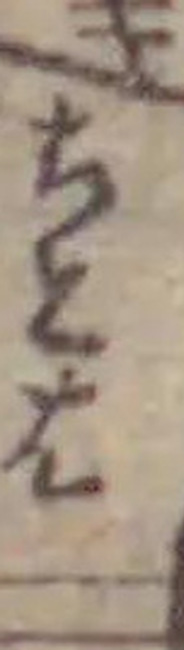ちとは
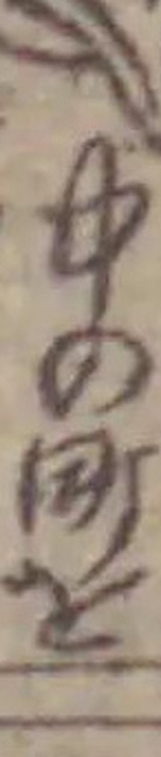中の町を
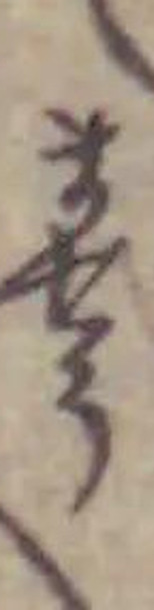ませう
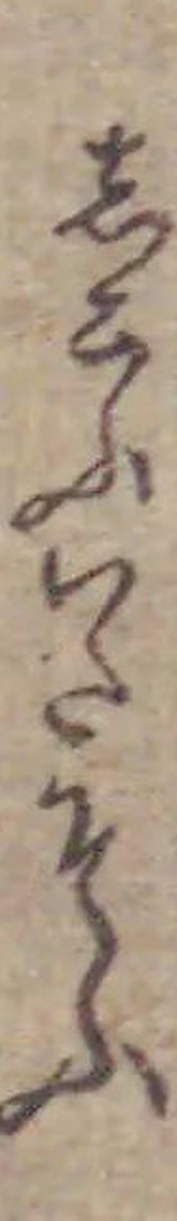しこふいたそふ
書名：名代干菓子山殿 3巻
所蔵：国立国会図書館 National Diet Library, JAPAN
